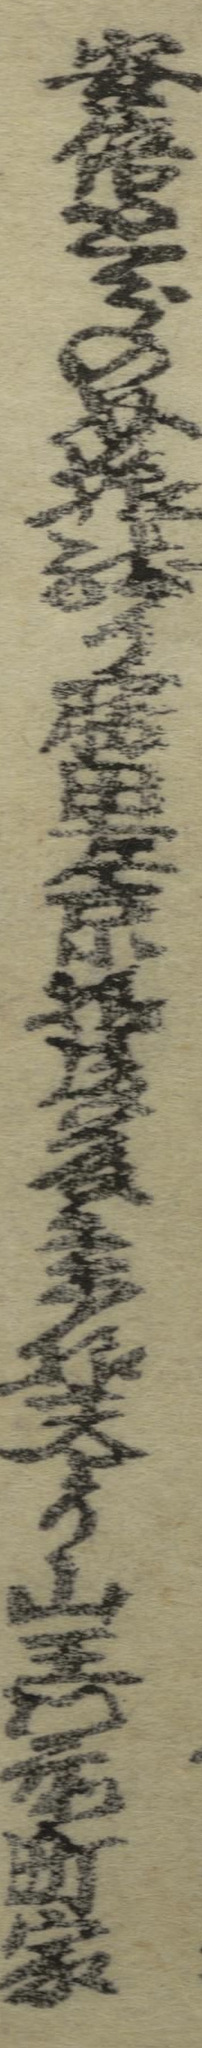安倍とらの介様残り勝田左京様後藤兵部様夫より山王門前町家
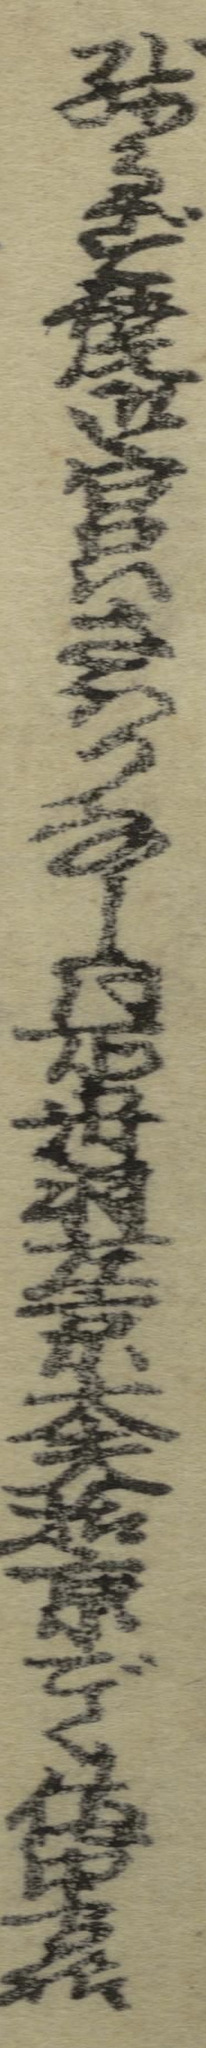残らず焼御宮はさはりなし同所丹羽左京大夫様京ごく備中守様
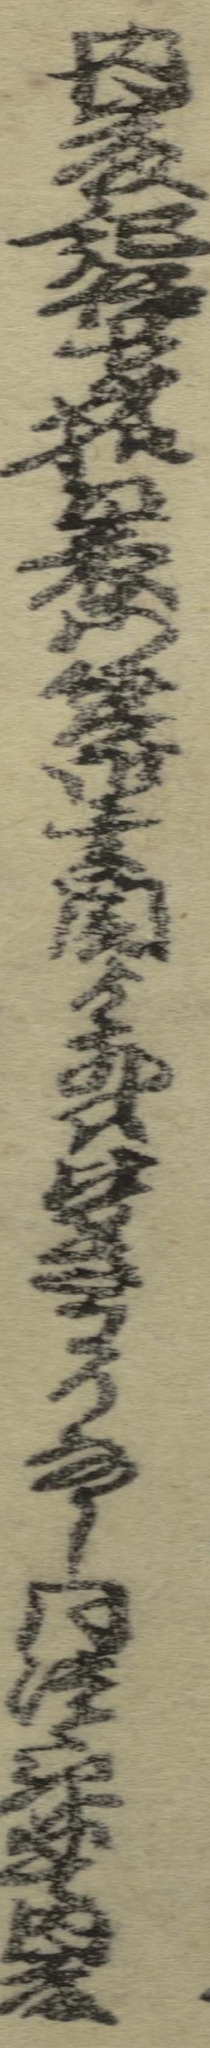内藤紀伊守様御表やしき御玄関ゟ外は皆さはりなし同つゝきにて内藤
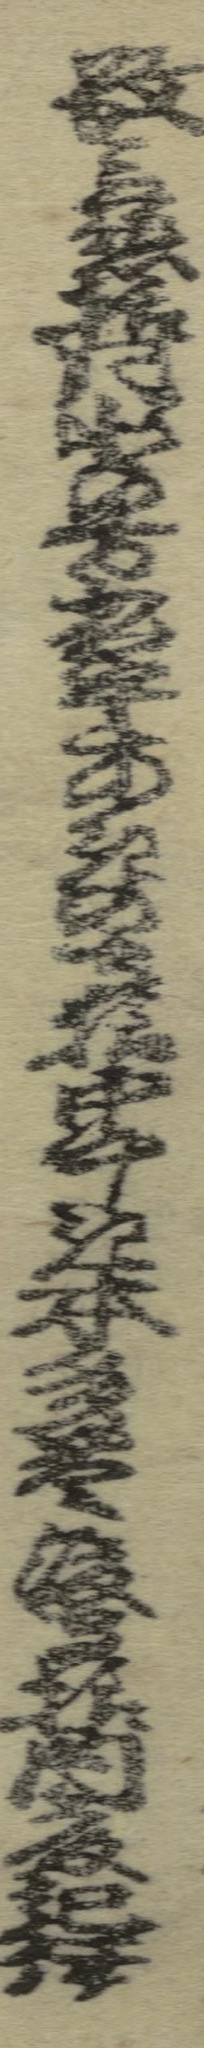敬之丞様同北の方松平あきの守様中やしき本多豊後守様内藤紀伊
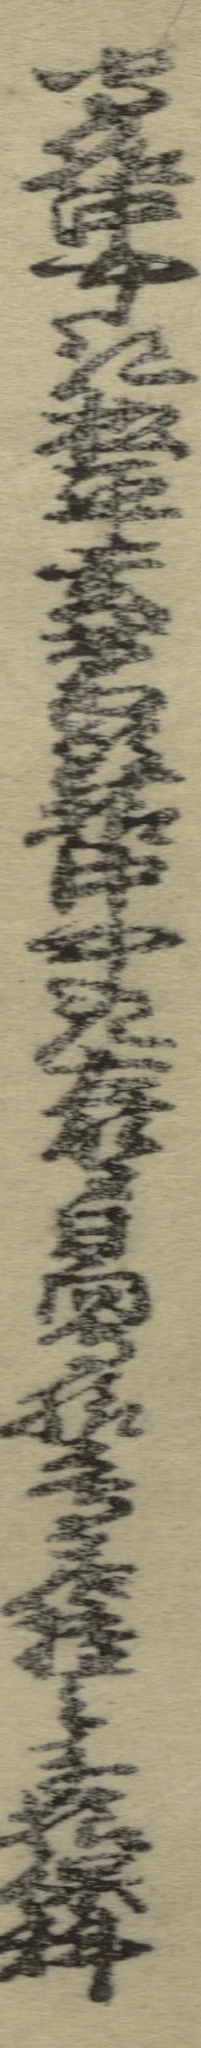守様中やしき松平玄蕃頭様中やしき左野日向守様鳥居権之進様保科
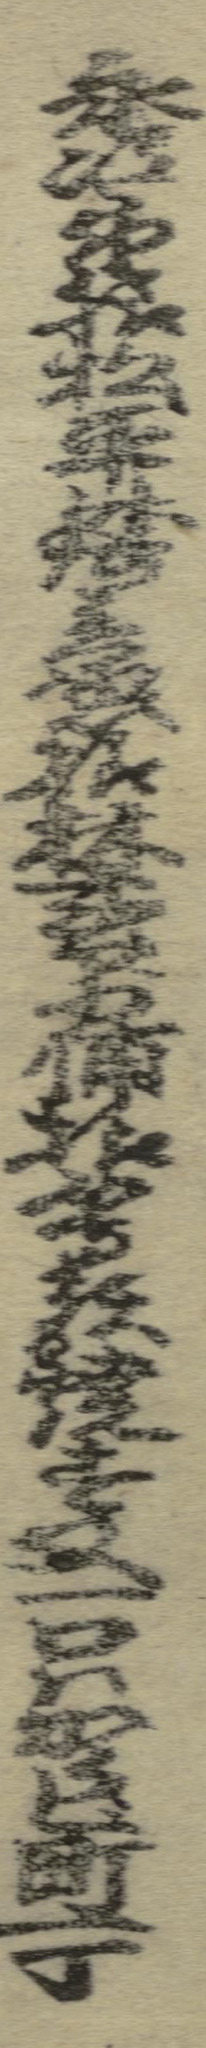永次郎様松平鋳之丞様林式部少輔様等類焼す又一口はかうじ町一丁
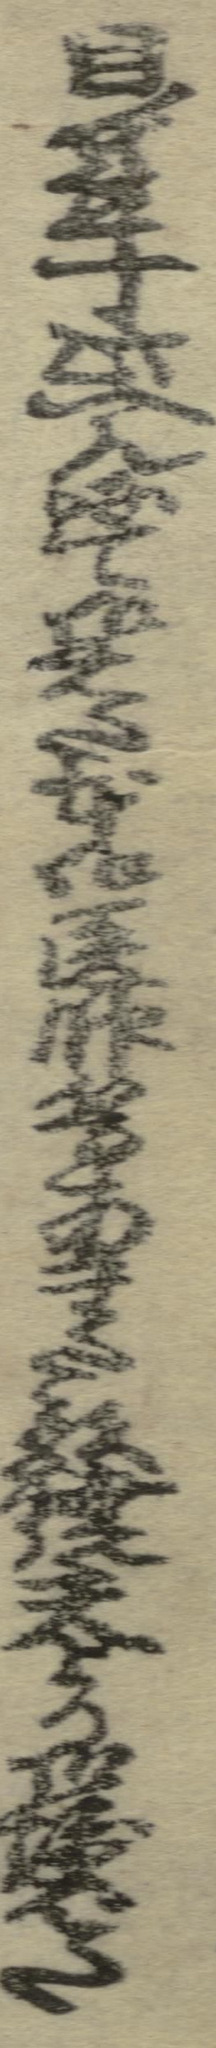目ゟ丁此へんにて御はた本御医師等あまた類焼夫より御堀はた
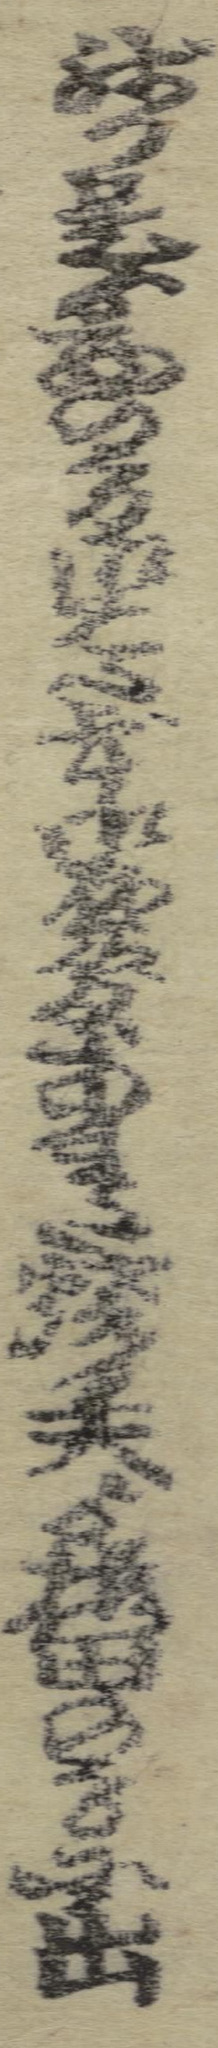残り是ゟ西の方御はた本御屋敷あまた焼る夫ゟ桜田のに出
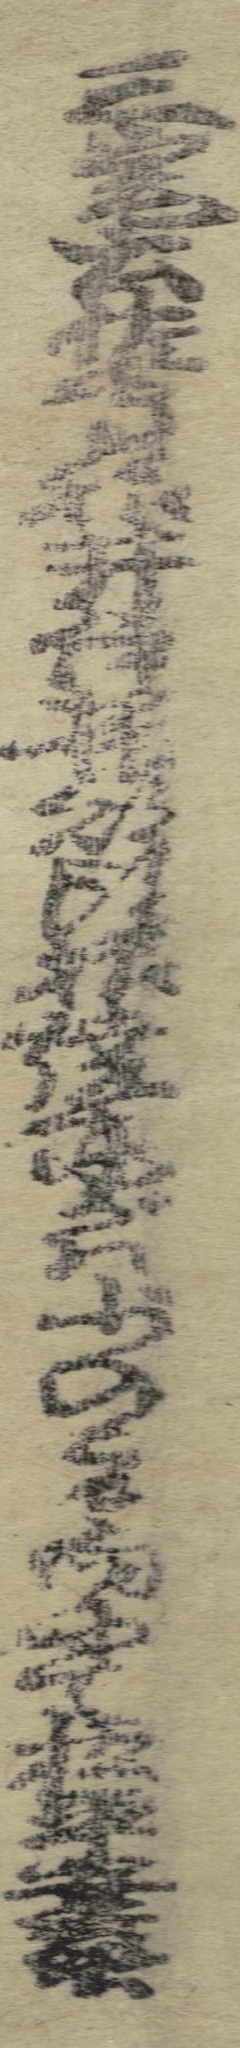三宅土佐守様井伊掃部頭様焼東がは少のこる向にて松平安芸
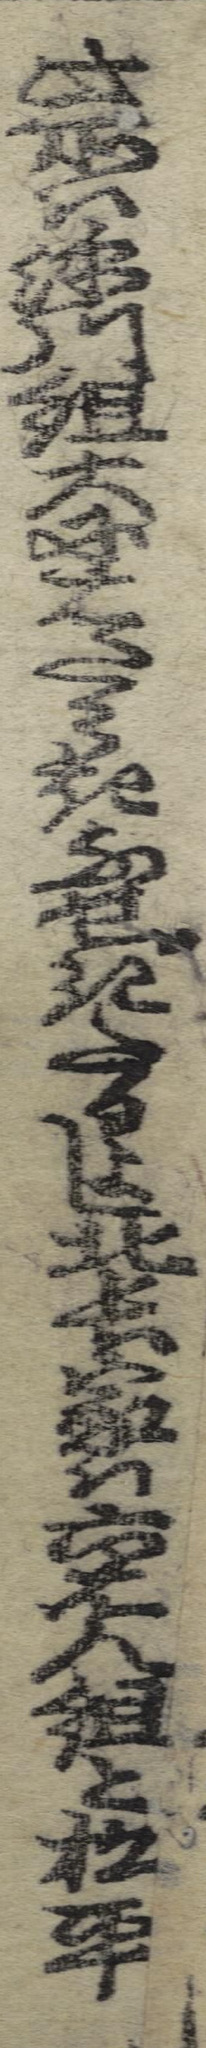此所は深川組大にはたらきふせぎたるよし北長家は六はん組と松平
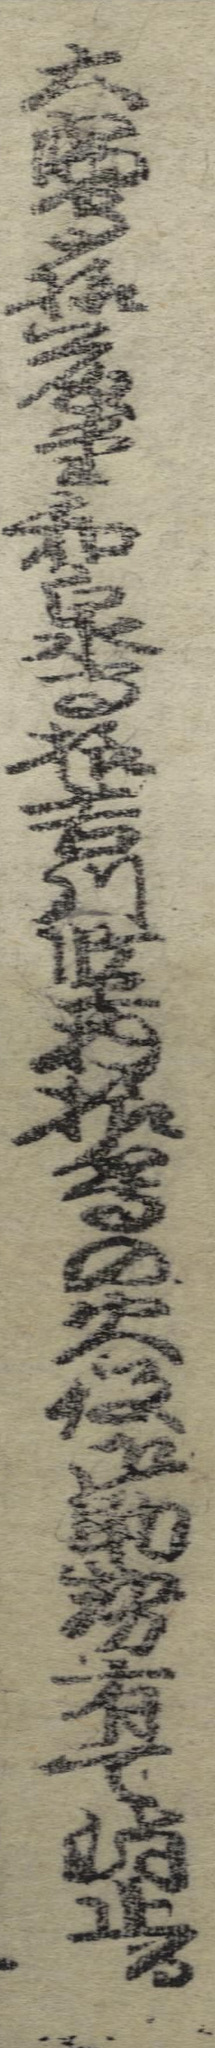大隅守様藤堂和泉守様吉川監物様等の火役御助勢有て消止る
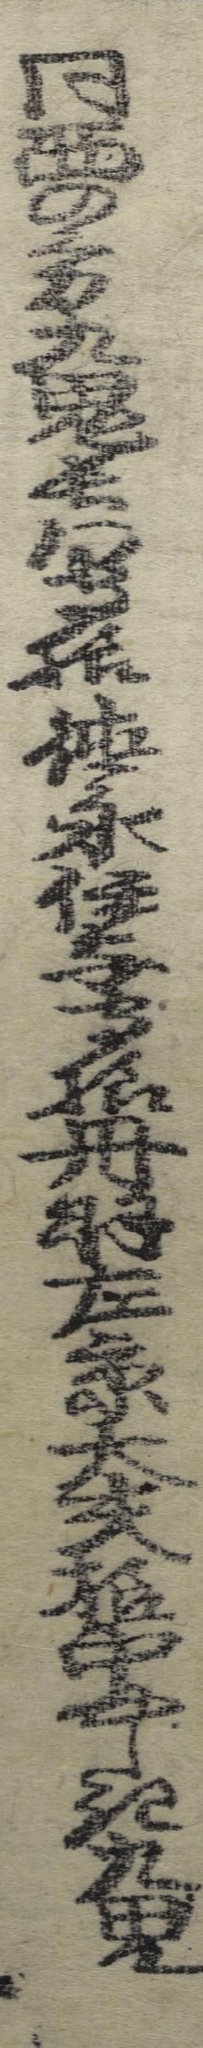同西の方九鬼長門守様徳永伊与守様丹羽左京大夫様中やしき九鬼
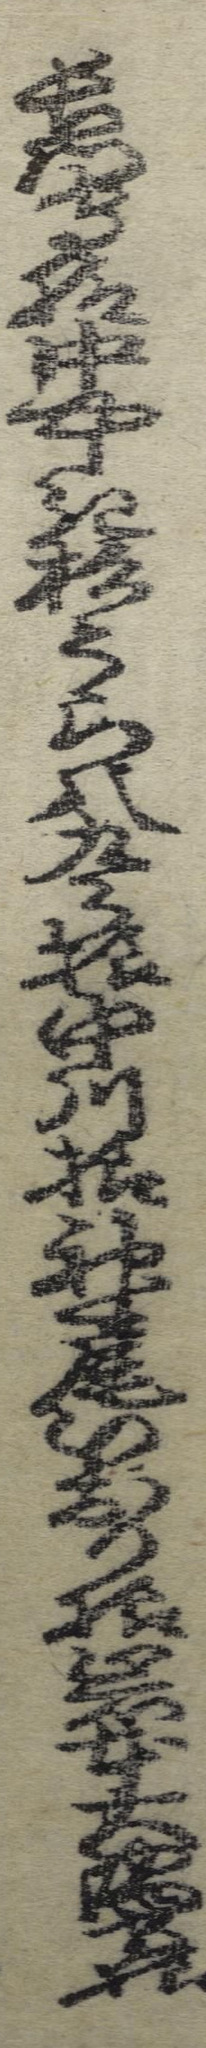長門守様中やしき杉うら八九郎様中川様神尾いおり様岩本大隅守様
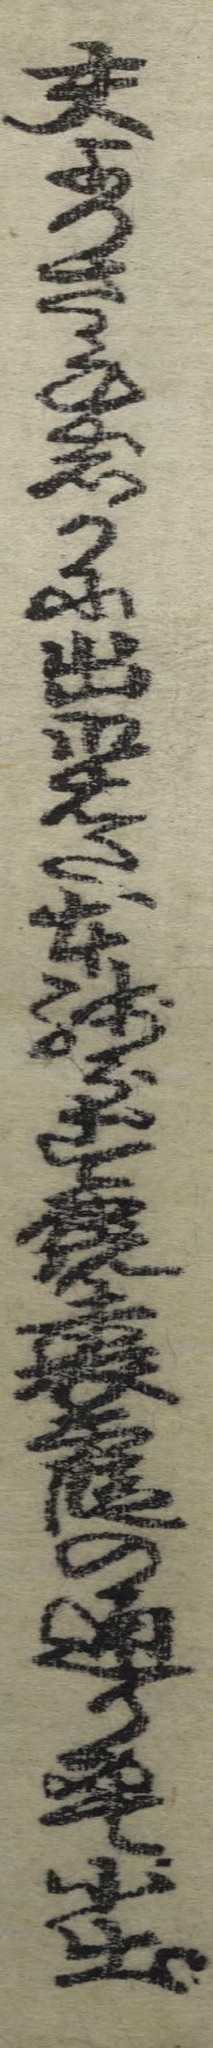夫よりさゝゐヰしりに出御はた本残らず焼裏霞の通りにて小出
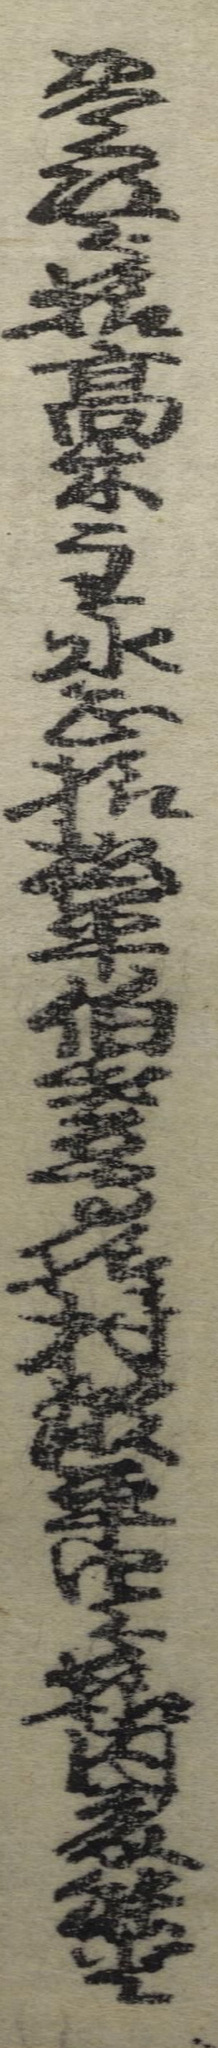豊次郎様高木主水正様松平伯耆守様村瀬平四郎様内藤能登
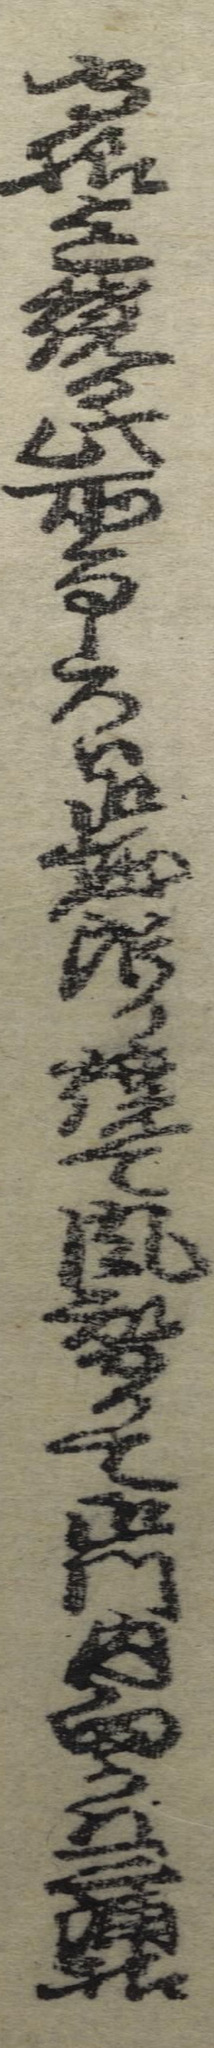守様迄焼る此所ろは御堀限り焼て風替りて御門内向かは三浦様
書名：[嘉永三年二月の江戸大火に関する瓦版]
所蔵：東京大学地震研究所図書室 Earthquake Research Institute Library, The University of Tokyo, JAPAN
